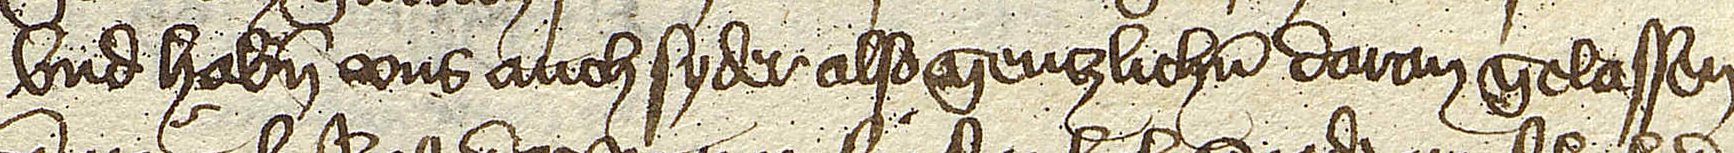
vnd habn* vns auch ſyder alſo gencʒlichn* daran gelaſſen
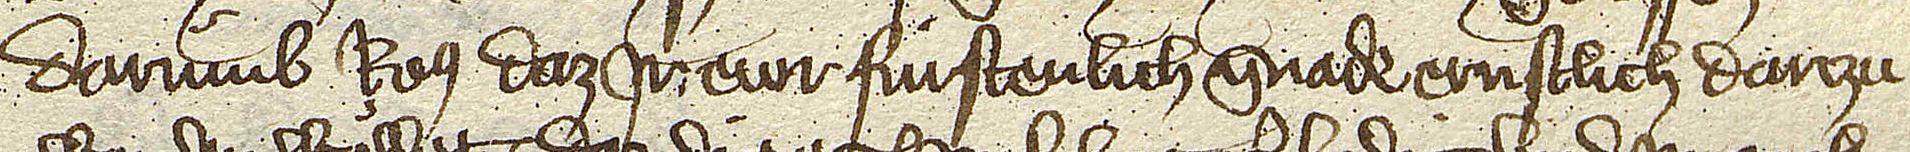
Darümb Ro* daʒ Ir ewr fürſtenlich gnade ernſtlich darcʒu
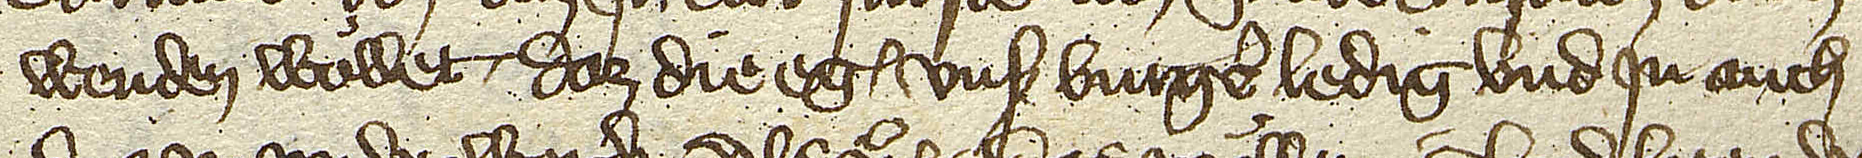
wenden wöllet / daʒ die eg* vnſ* burge* ledig vnd In auch
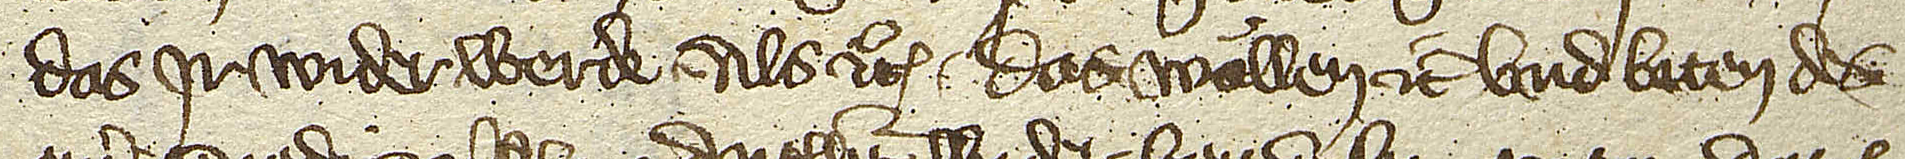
das Ir wider werde ~ Als ec* / das wöllen ec* vnd biten des
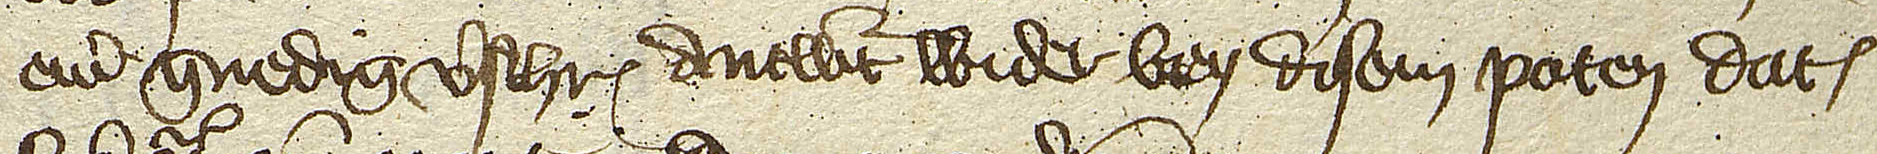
ew* gnedig v*ſchr* Antwt* wider bey diſem poten dat*
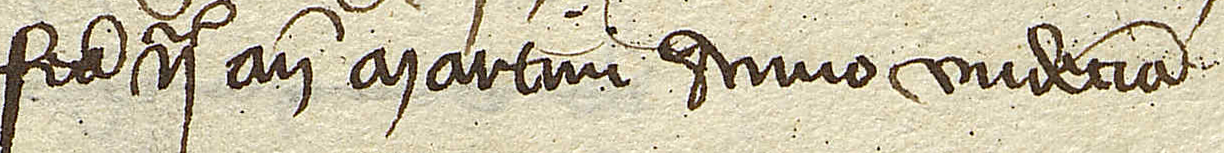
fia* ii* an* Martini Anno vndecio*
